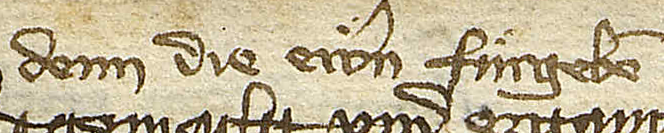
denn die ew*n fürgebe*
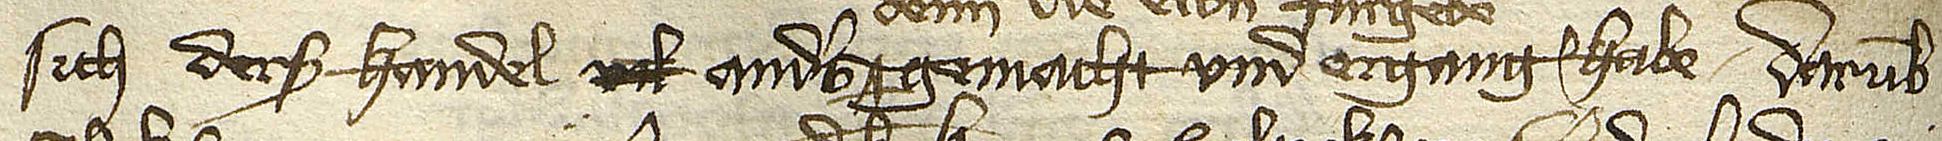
ſich derſ* handel vil and*s gemacht vnd ergang* habe / Darub*
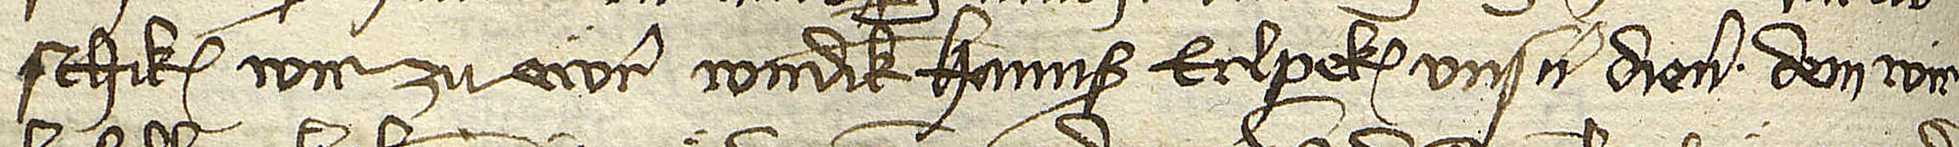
ſchik* wir ʒu ewr* wirdik* Hannſ* Erlpek* vnſ*n dien* . dem wir
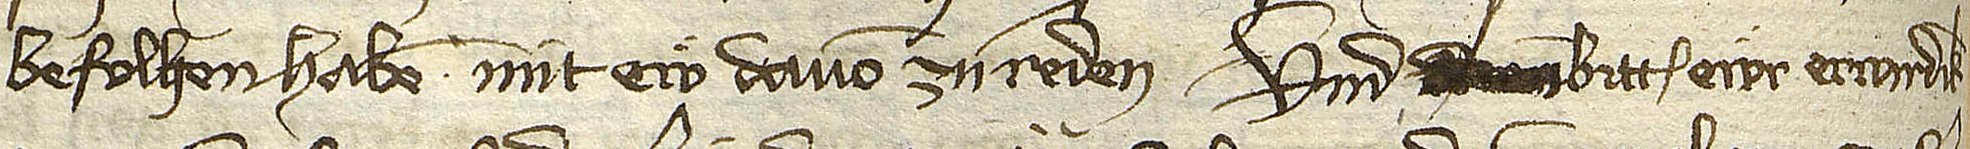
befolhen habe* . mit ew dauo* ʒu reden / Vnd daru* bitt* ewr erwirdik*
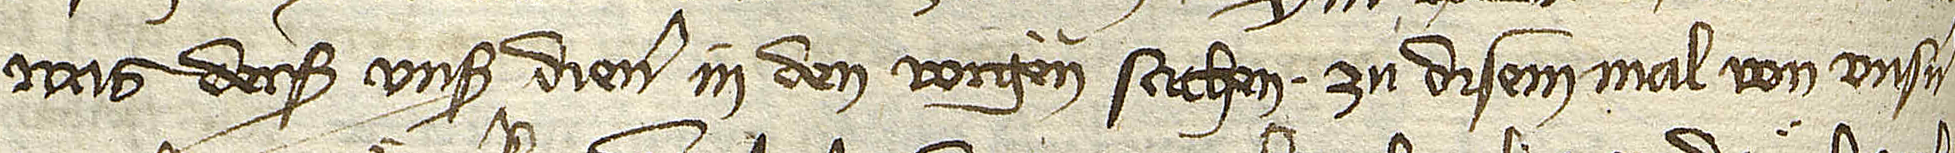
was derſ* vnſ* dien* in den vorgen* ſachen . ʒu diſem mal von vnſn*
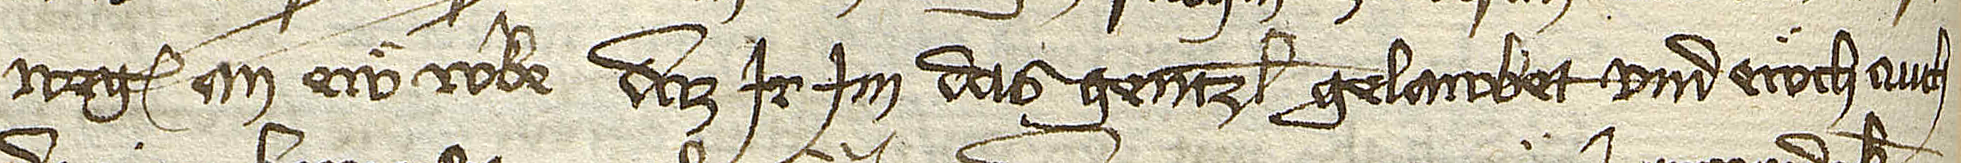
weg* an ew w*be daʒ Ir Im das gencʒl* gelawbet vnd ewch auch
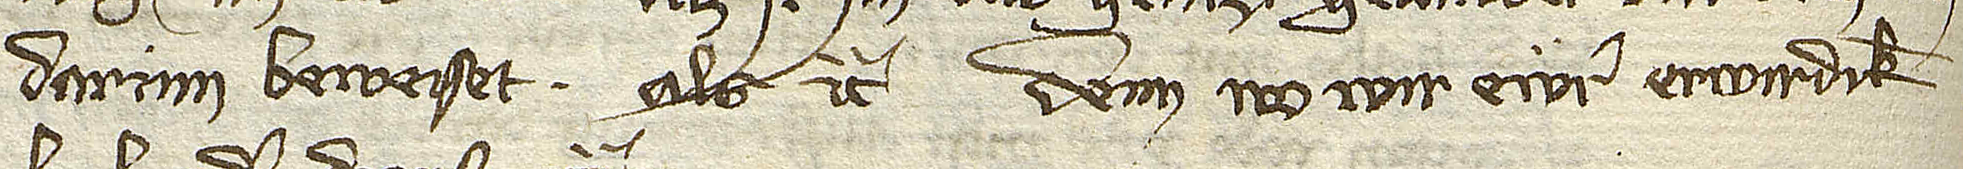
darinn beweiſet . als ec* Denn wo wir ewr* erwirdik*
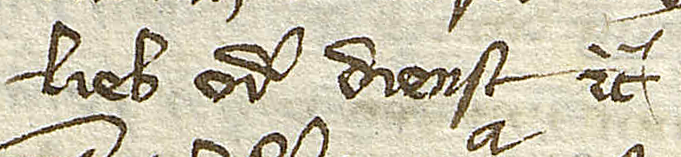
lieb od* dienſt ec*
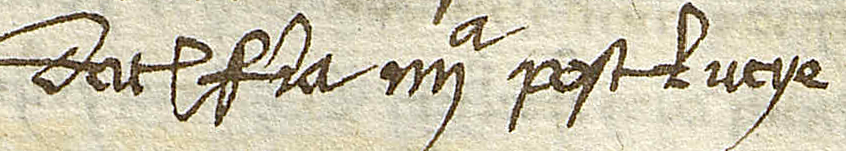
Dat* f*ia iiii* poſt Lucye
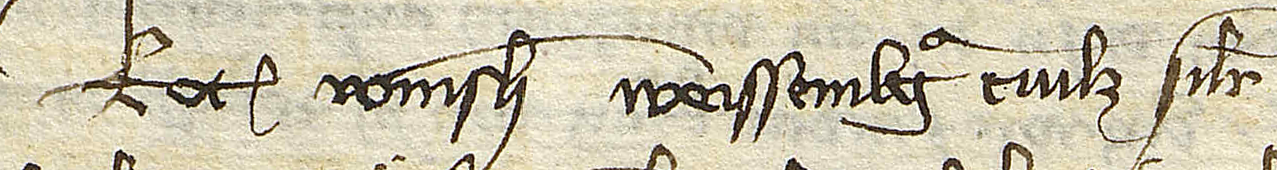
Rot* winſh* weiſſembg* cuil* ſilr*
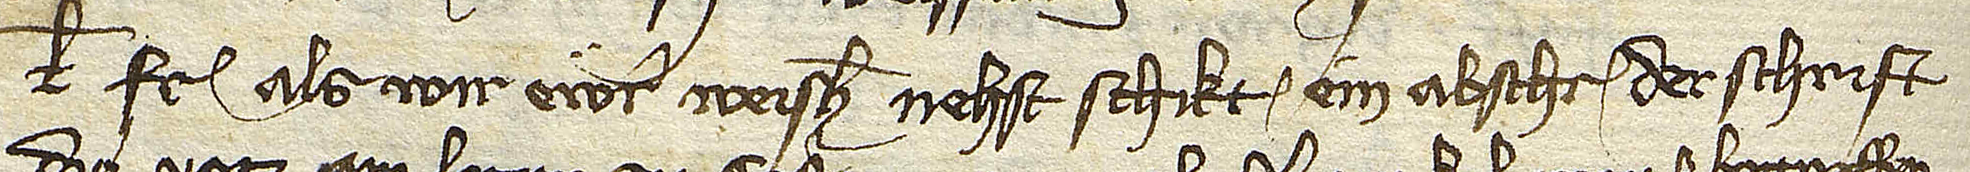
L* fr* als wir ewr* weiſh* nehſt ſchikt* ein abſchr* der ſchrift
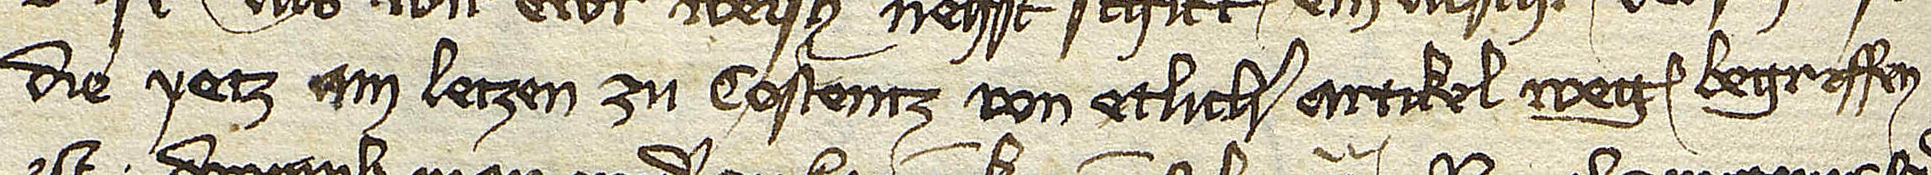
die yecʒ am lecʒen ʒu Coſtencʒ von etlich* artikel weg* begriffen
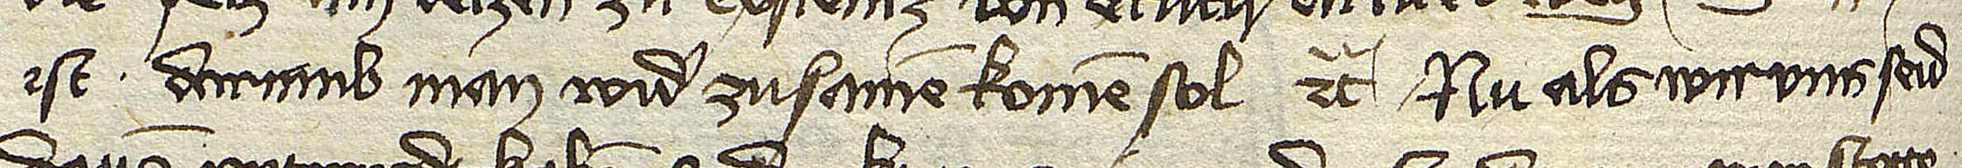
iſt . darumb man wid* ʒuſame* kome* ſol ec* / Nu als wir vns ſeid
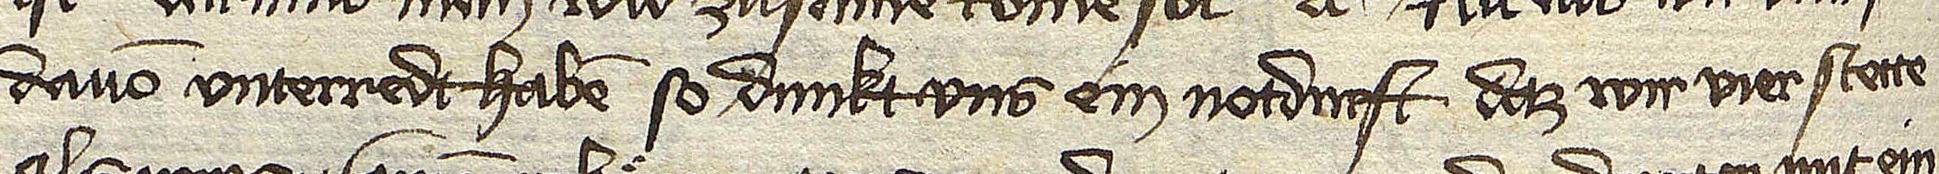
dauo* vnterredt habe* ſo dunkt vns ein notdurft daʒ wir vier ſtette
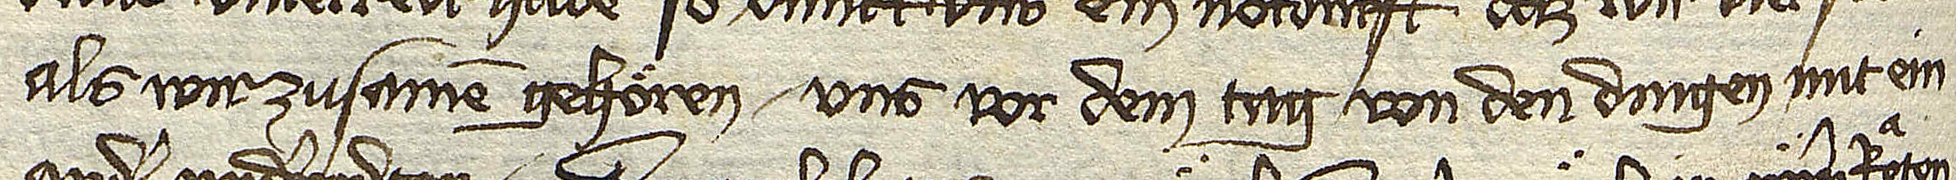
als wir ʒuſame* gehören / vns vor dem tag von den dingen mit ein
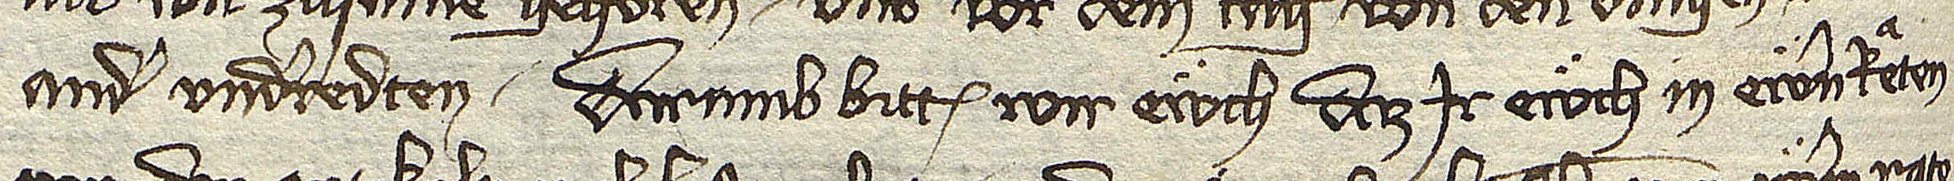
and* vnd*redten / Darumb bitt* wir ewch daʒ Ir ewch in ewn* Rëten
